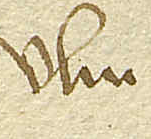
Vlm
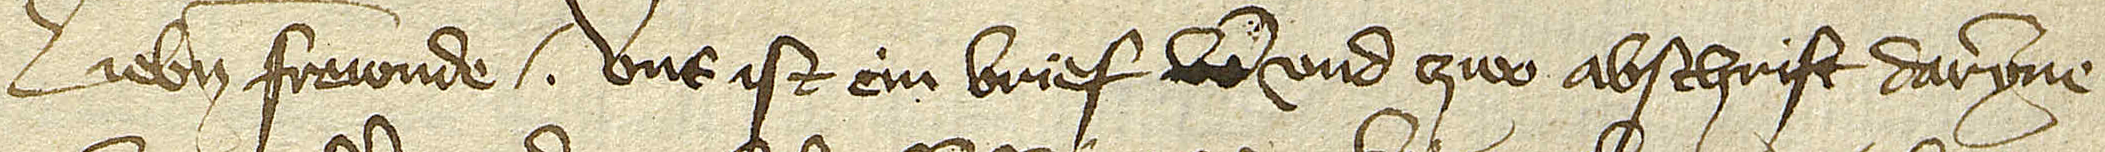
Liebn* frewnde /. Vns iſt ein brief vo* vnd cʒwo abſchrift dary*ne
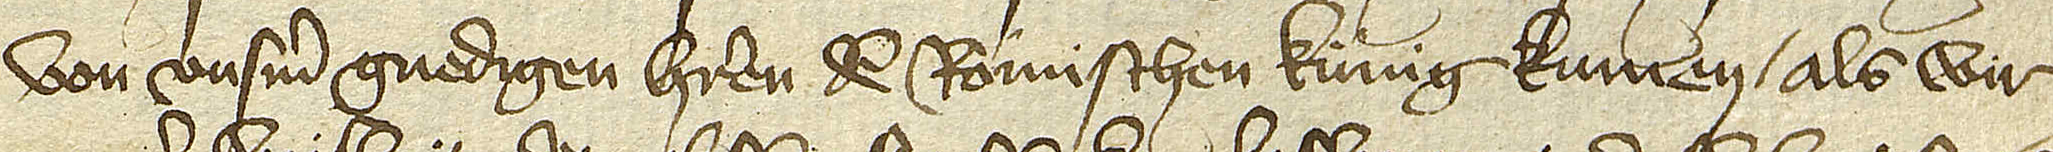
von vnſm* gnedigen hr*en d* Römiſchen künig kumen / als wir
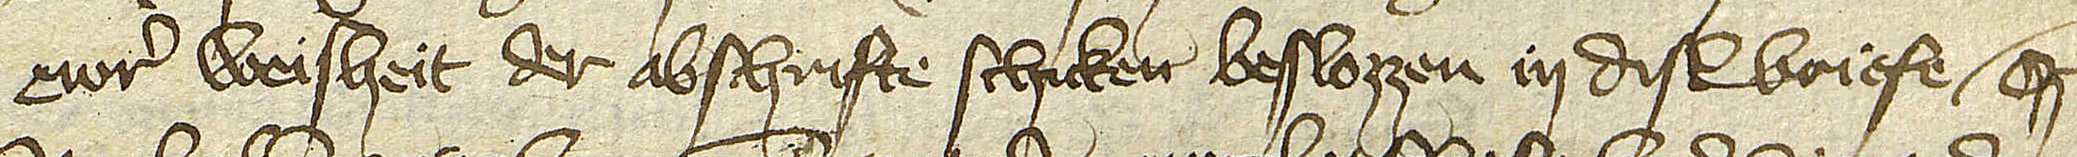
ewr* weiſheit der abſchrifte ſchicken beſloʒʒen in diſe briefe / %
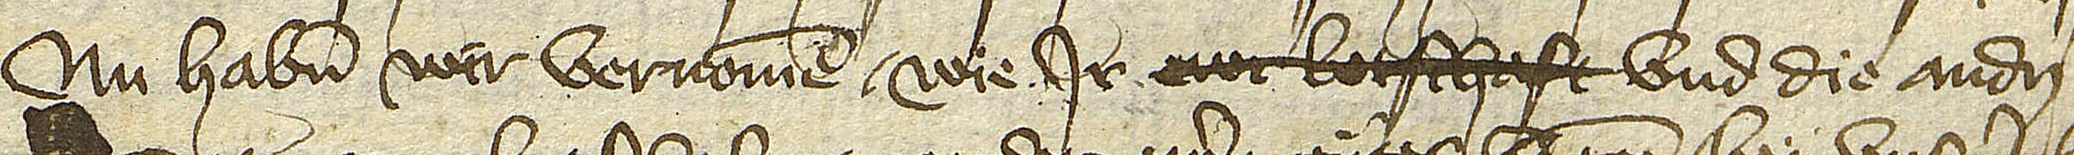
Nu habn* wir vernome* / wie Ir ewr botſchaft vnd die andn*
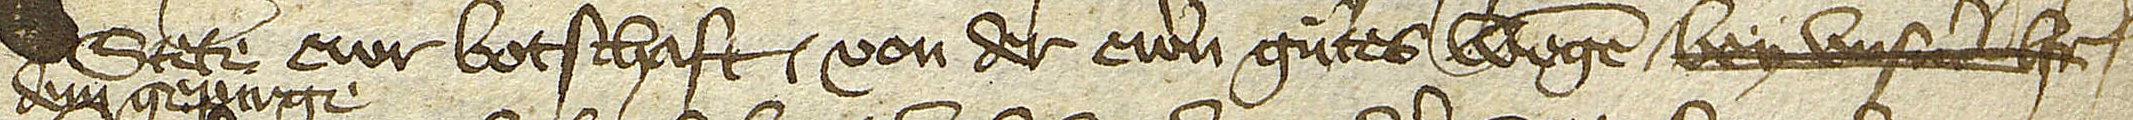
Stete ewr botſchaft / von der ew*n gütes wege* / bey vnſn* hr*
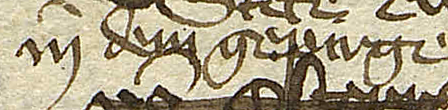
in* dem gepirge
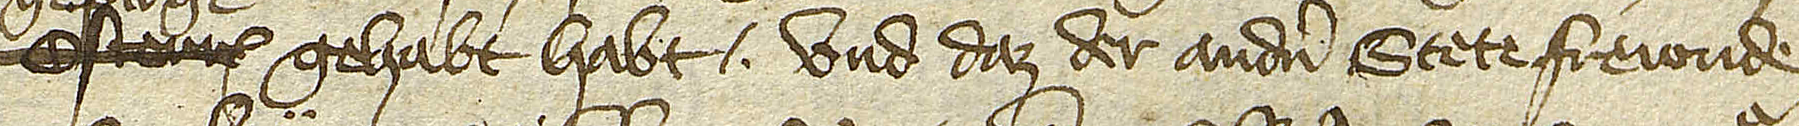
vo* Öſterr* gehabt habt /. vnd daʒ der andn* Stete frewnde
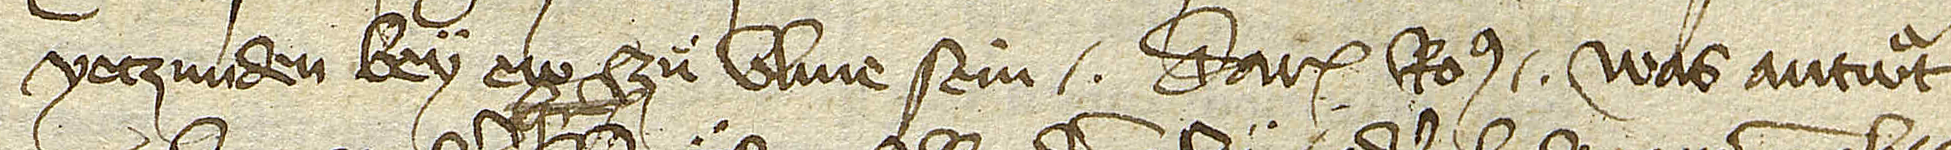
yecʒunden bey ew cʒü vlme ſein / . Dar* Ro* / . was antwt*
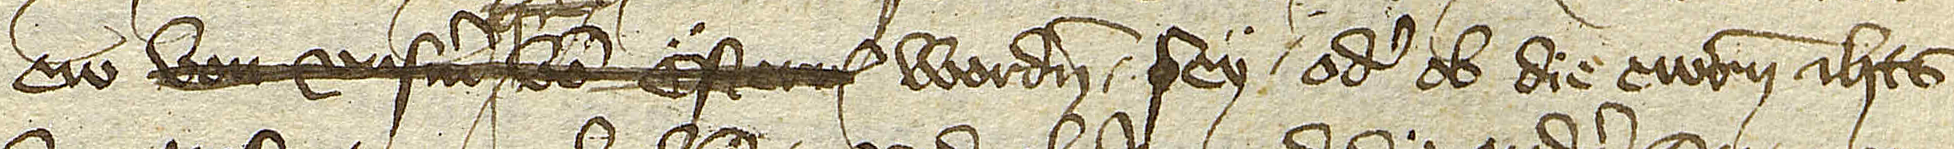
ew* von vnſm* vo* Öſterr* wordn* / ſey / od* ob die ew*rn ihts
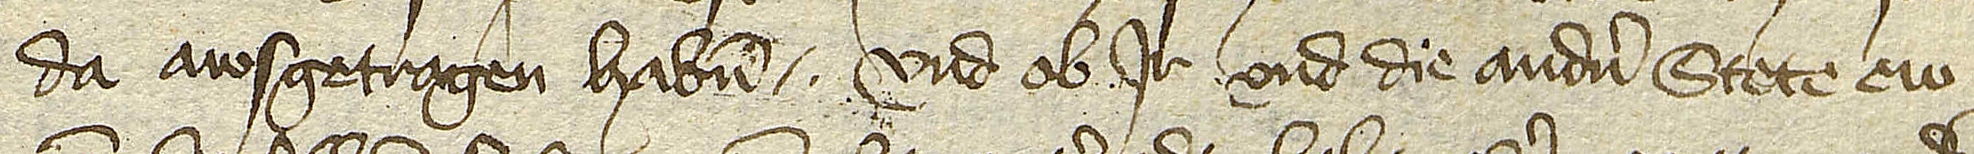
da awſgetragen habn* /. vnd ob Ir vnd die andn* Stete ew*
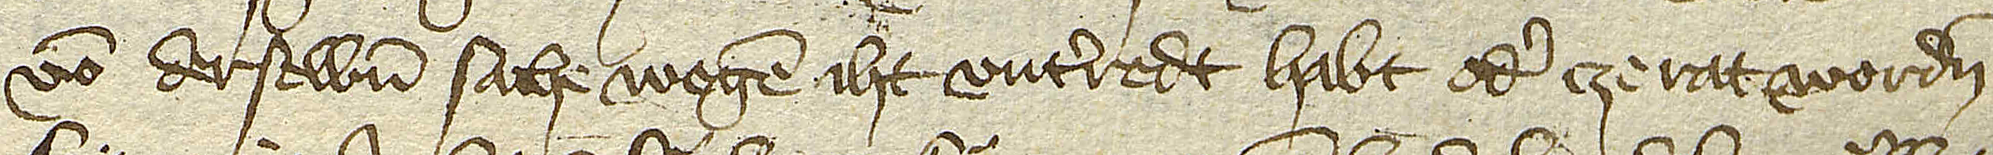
vo* derſelbn* ſache wege* iht vnt*redt habt od* cʒe rat wordn*
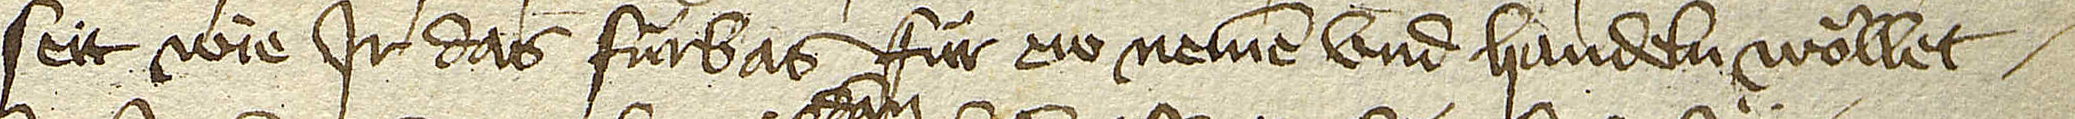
ſeit wie Ir das fürbas für ew neme* vnd handeln wöllet /
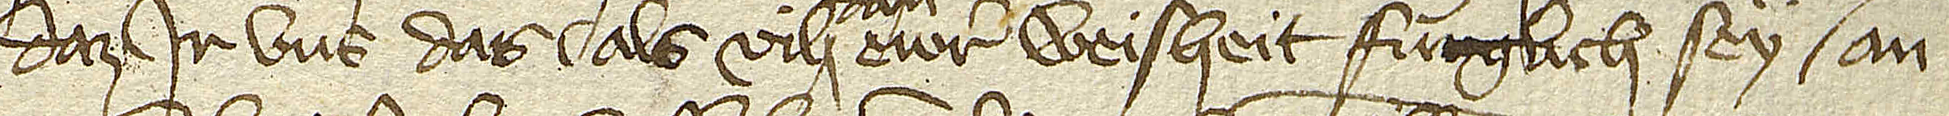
daʒ Ir vns das / als vil ewr* weiſheit fürglich ſey / an
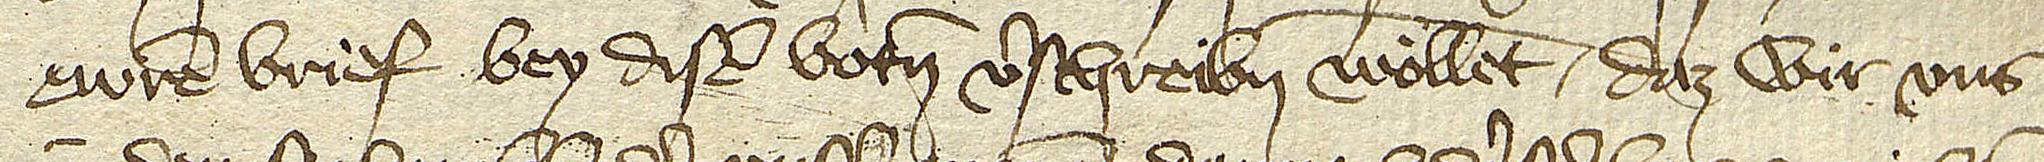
ewre* brief bey diſe botn* v*ſchreibn* wöllet / daʒ wir vns
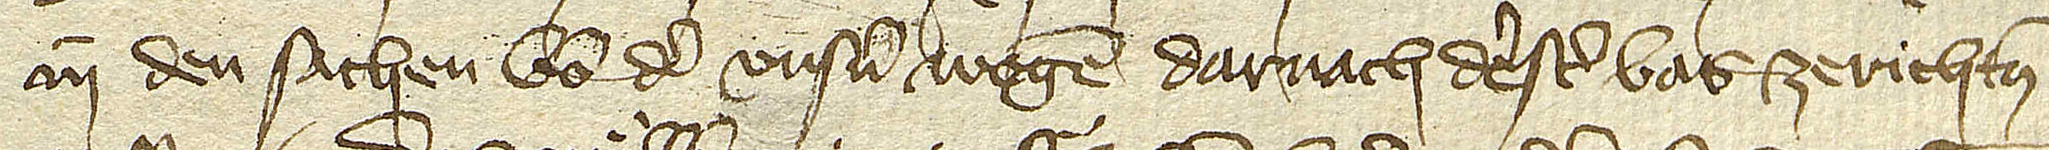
in den ſachen vo* d* vnſn* wege* darnach de*ſt* bas cʒerichtn*
